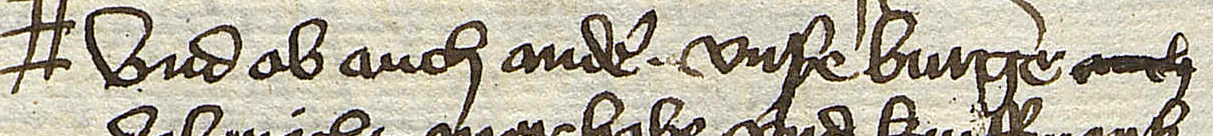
Vnd ob auch ande* ~ vnſ*r burge* auch
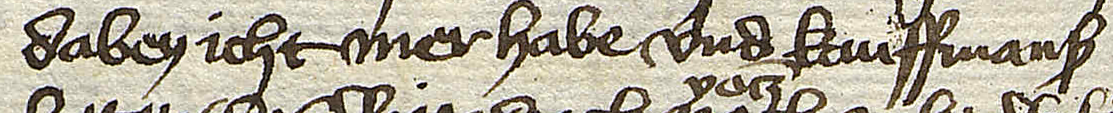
dabey icht mer habe vnd kauffmanſ*
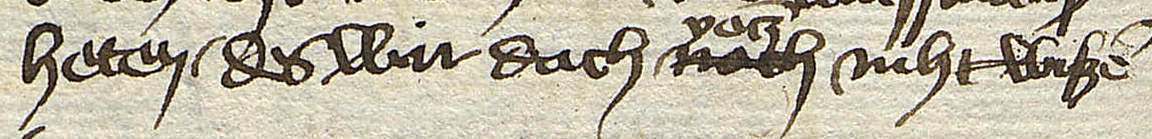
heten / des wir doch noch niht wiſʒe*
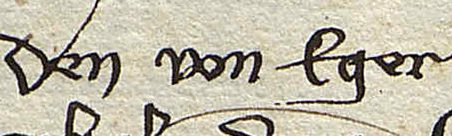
Den von Eger
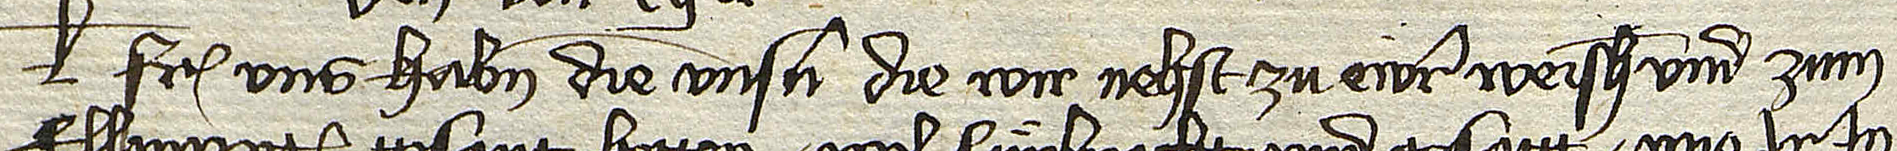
L* fr* vns habn* die vnſn* die wir nehſt ʒu eẅr* weiſh* vnd ʒum
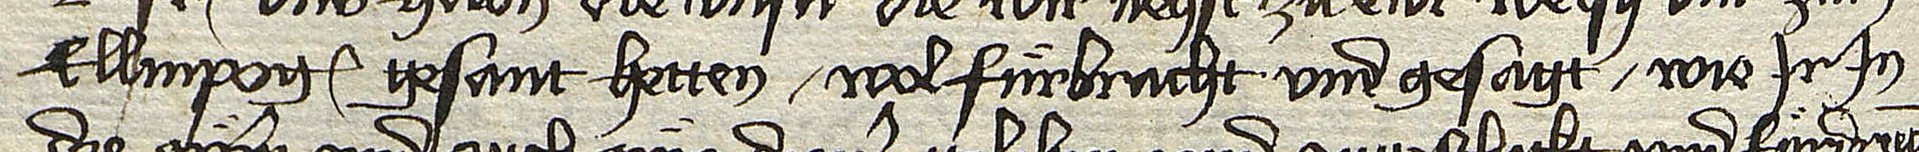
Ellmpog* geſant hetten / wol fürbracht vnd geſagt / wie Ir In
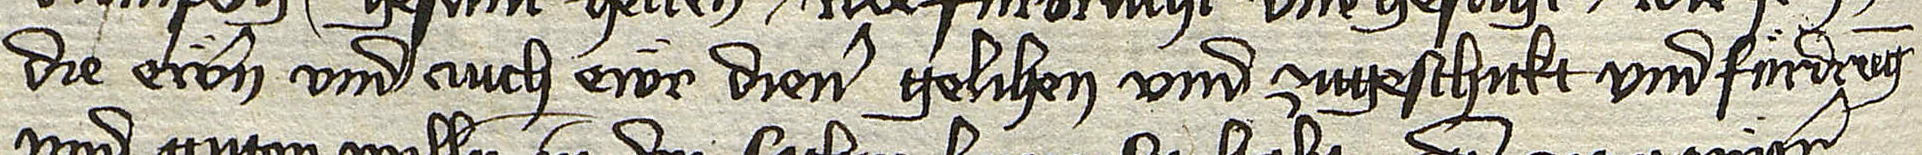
die eẅ*n vnd auch eẅr dien* gelihen vnd ʒugeſchikt vnd fürdru*g
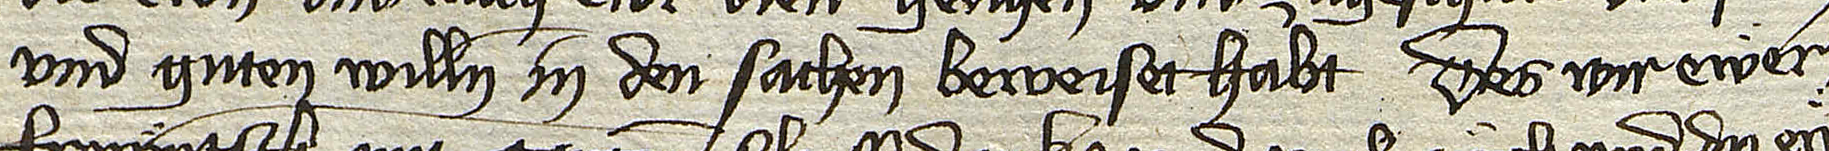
vnd guten willn* in den ſachen beweiſet habt / Des wir eẅer*
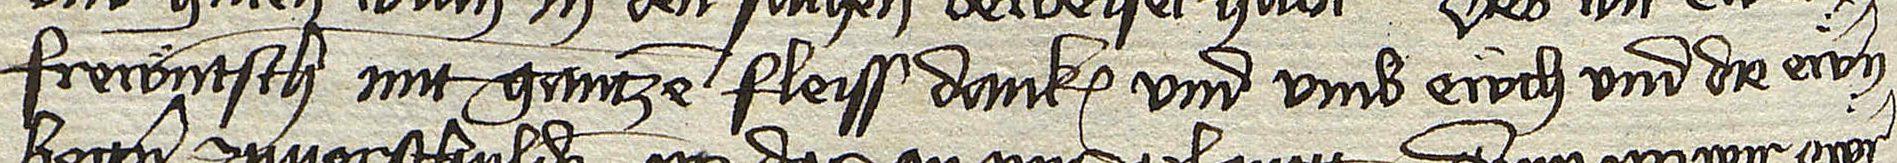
freẅntſch* mit gancʒe* fleiſſ dank* vnd vmb eẅch vnd die eẅ*n
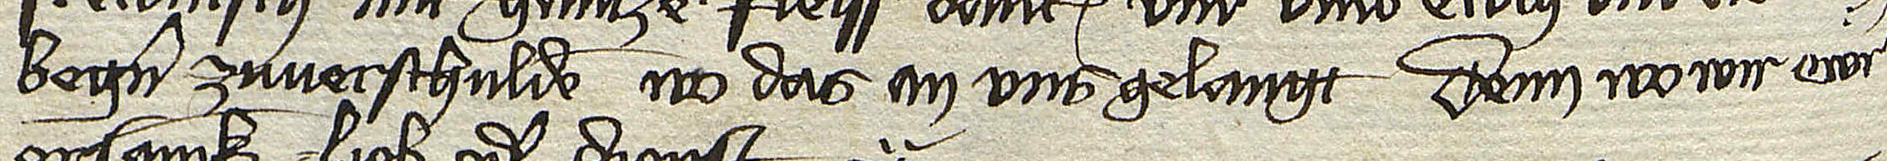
beg*n ʒuuerſchulde* wo das an vns gelangt Denn wo wir eẅr*
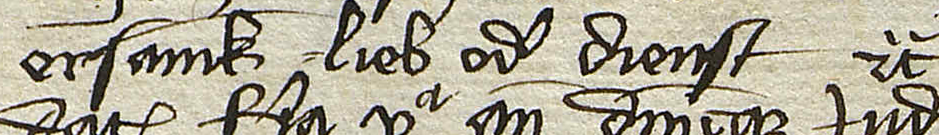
erſamk* lieb od* dienſt ec*
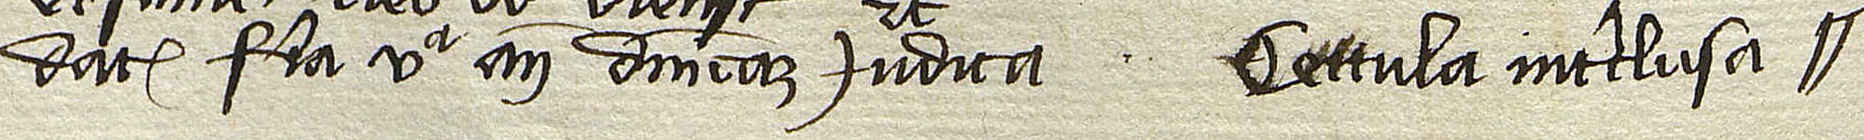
dat* fi*a v* an* d*nica* Iudica Cettula int*cluſa
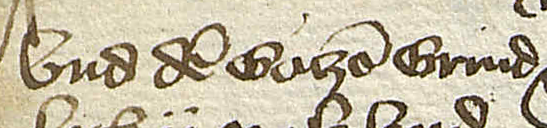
vnd de* Göcʒe* Grind
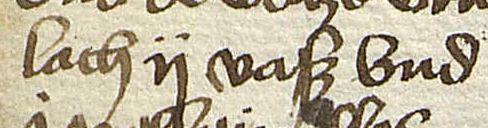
loch ii vaſʒ vnd
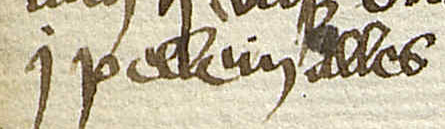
i pellein Alles
